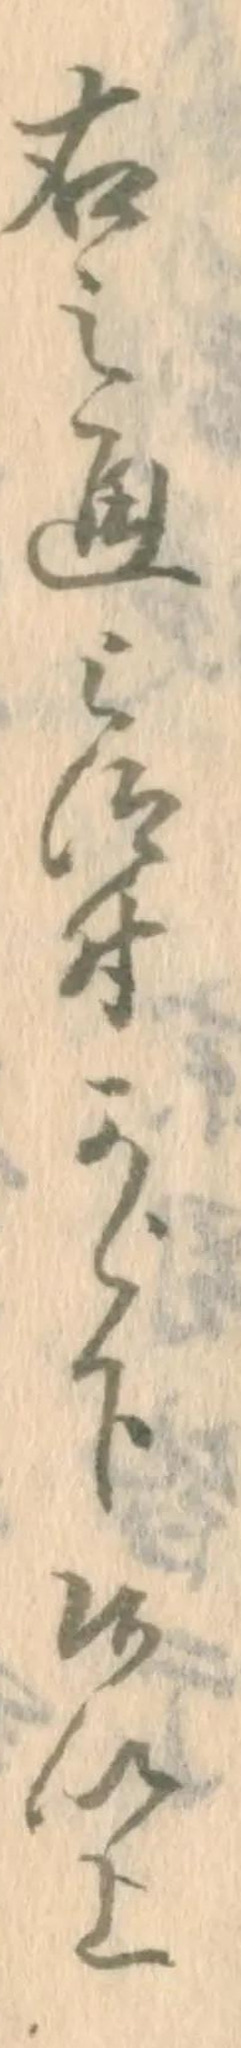右之通被仰付可被下候以上
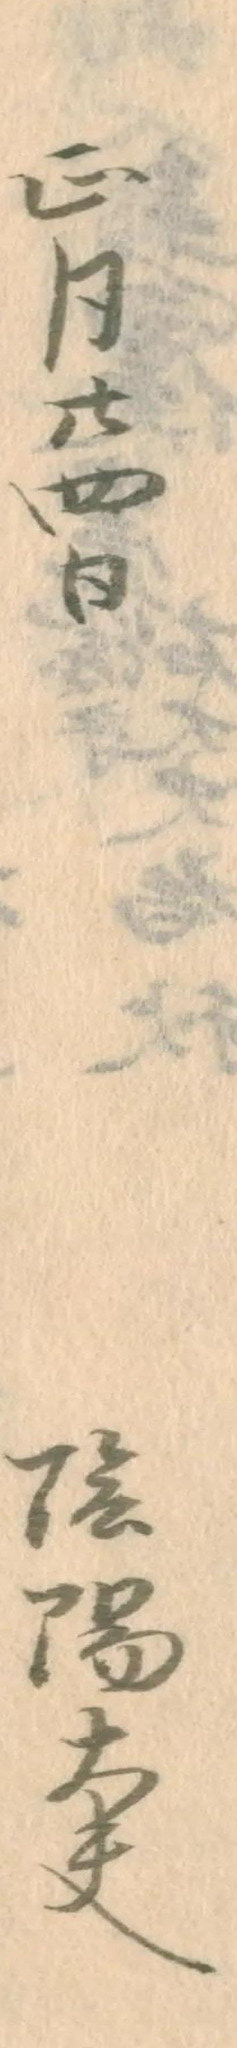正月廿四日陰陽大夫
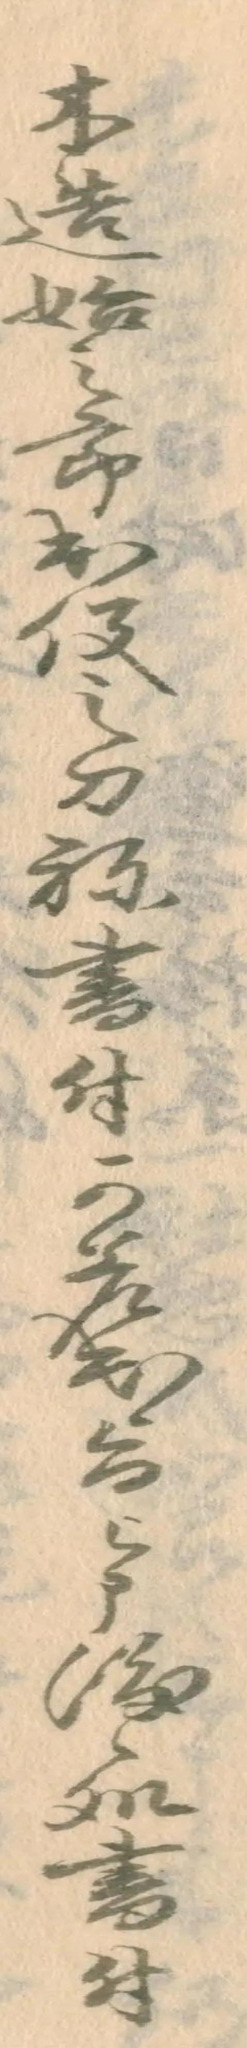一木造始之節出役之刀祢書付可差出旨被申渡候処書付
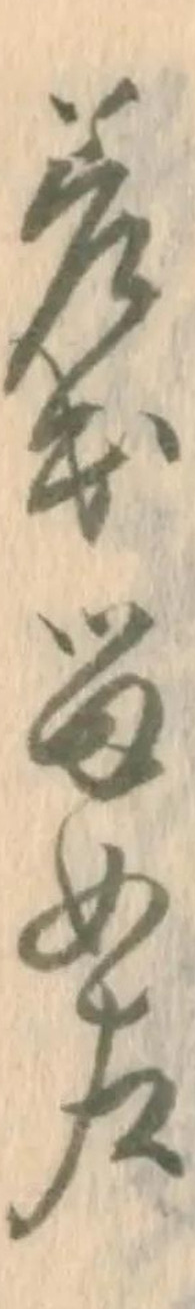差出留如左
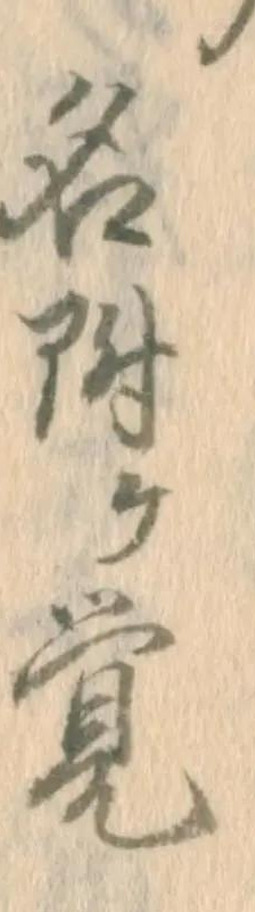名附ケ覚
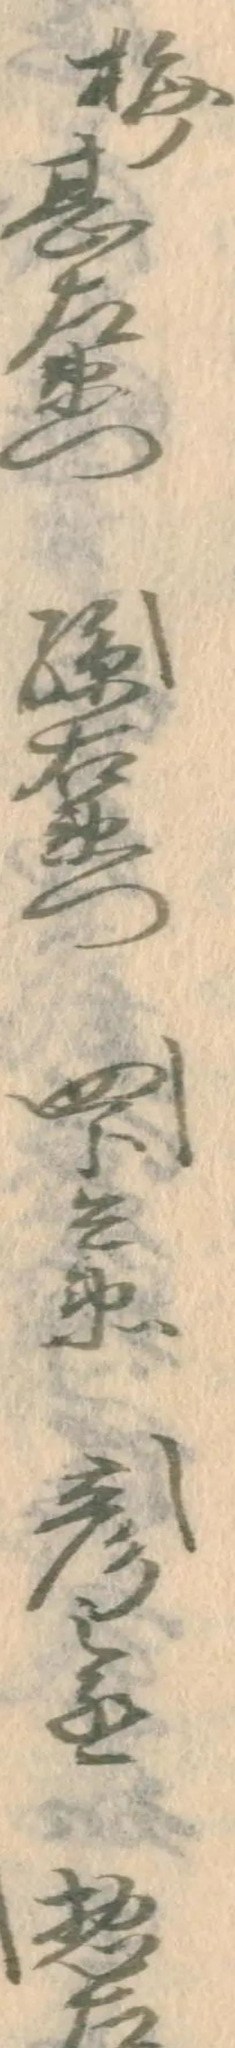甚左衛門孫右衛門四郎兵衛彦之丞惣左衛門
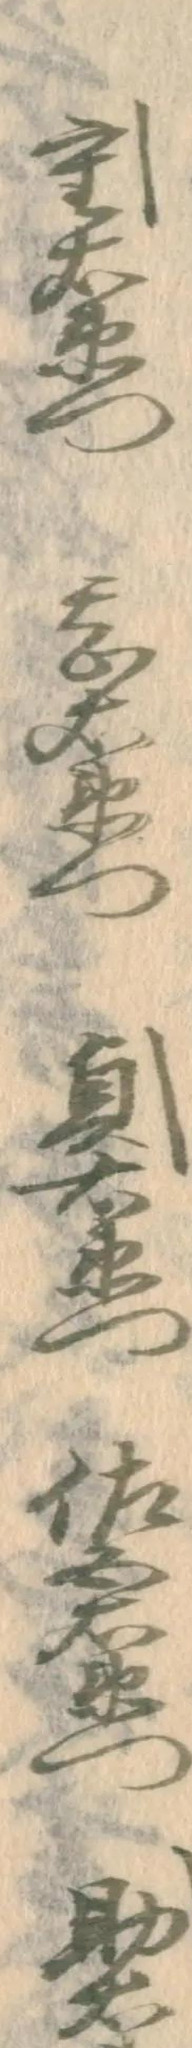重右衛門甚右衛門貞右衛門佐五右衛門助右衛門
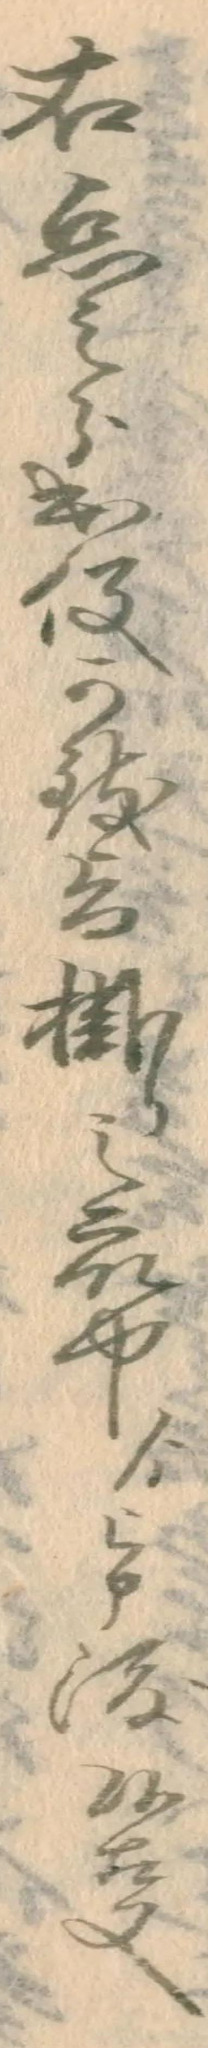右点之分出役可致旨掛り之衆中ゟ被申渡候事
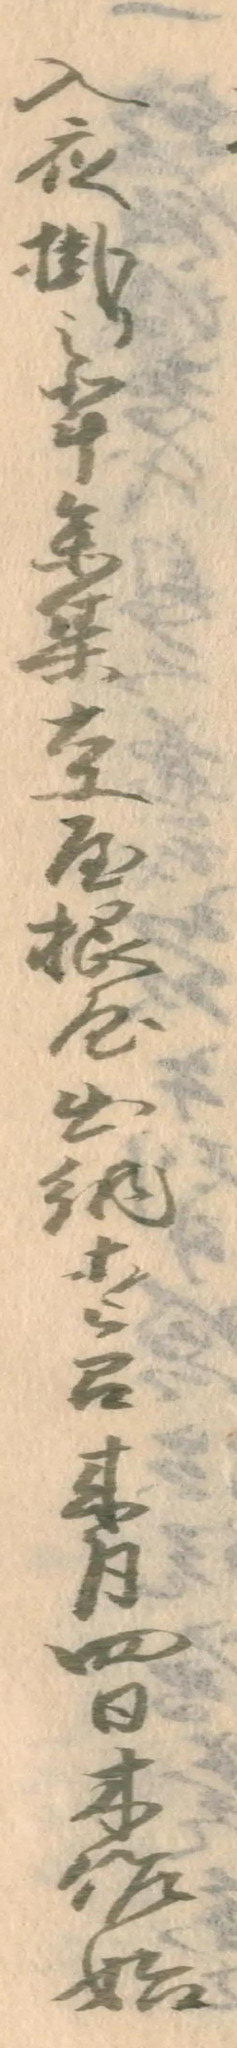一入夜掛り之輩参集大工屋根屋出納等被召来月四日木作始
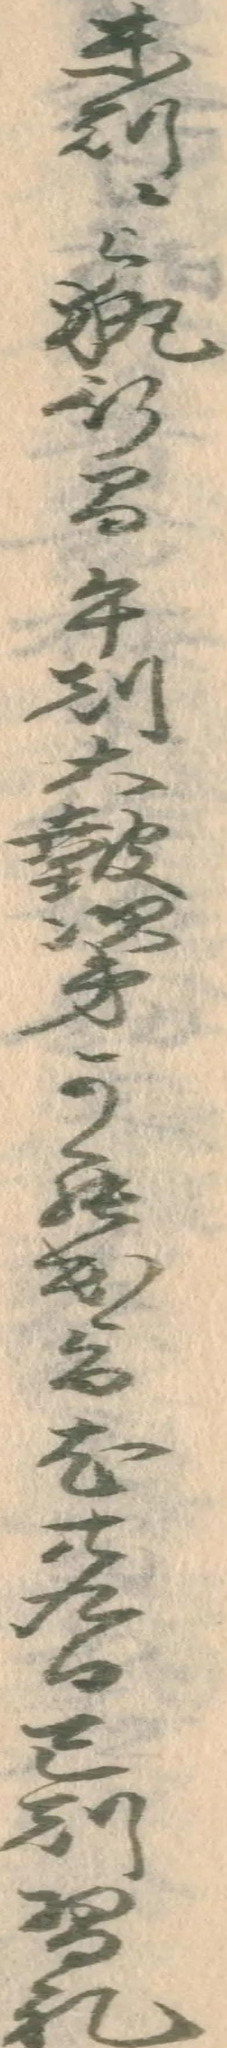未刻ニ被執行間午刻大鼓次第可罷出旨尤廿九日巳刻習礼
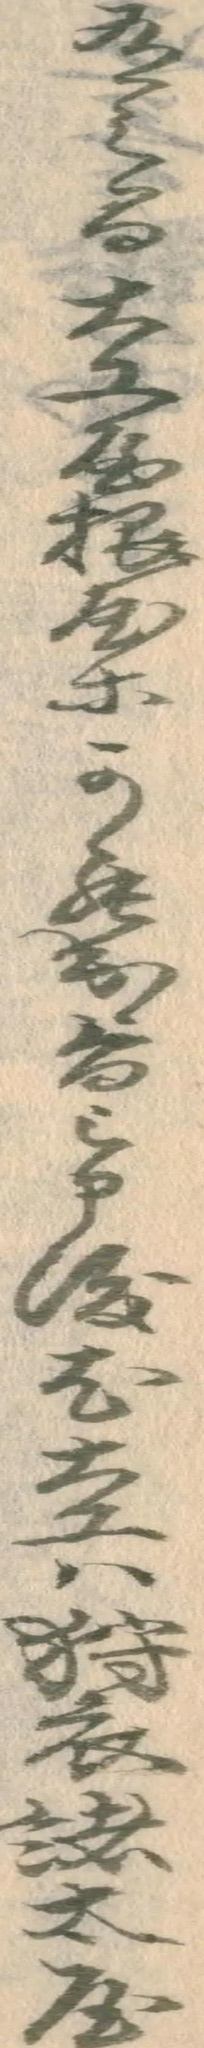有之間大工屋根屋等可罷出旨被申渡尤大工ハ狩衣諸太屋
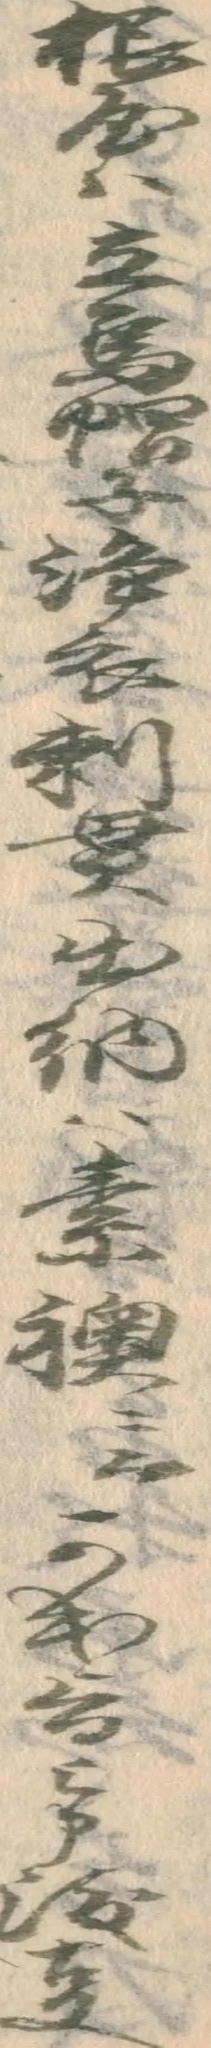根屋ハ立烏帽子浄衣刺貫出納ハ素襖ニ而可出旨被申渡事
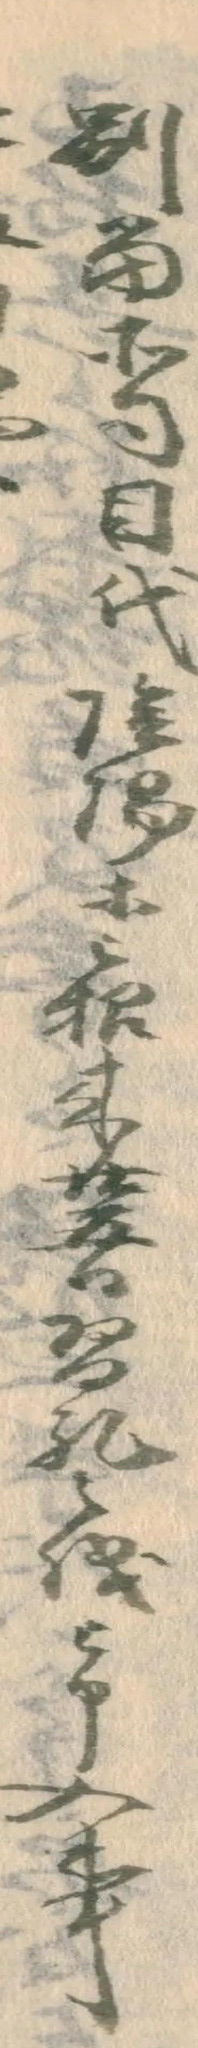一別当所司目代陰陽等被招来廿五日習礼之儀被申入事
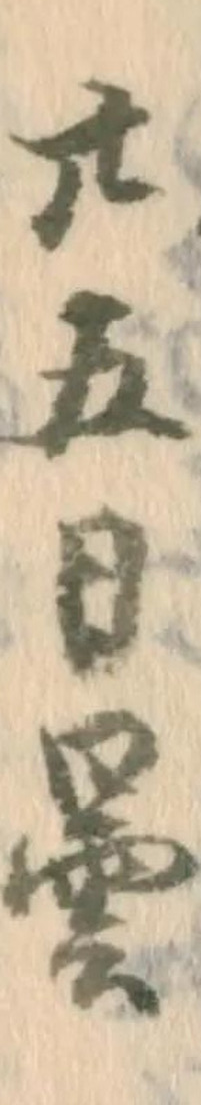廿五日曇
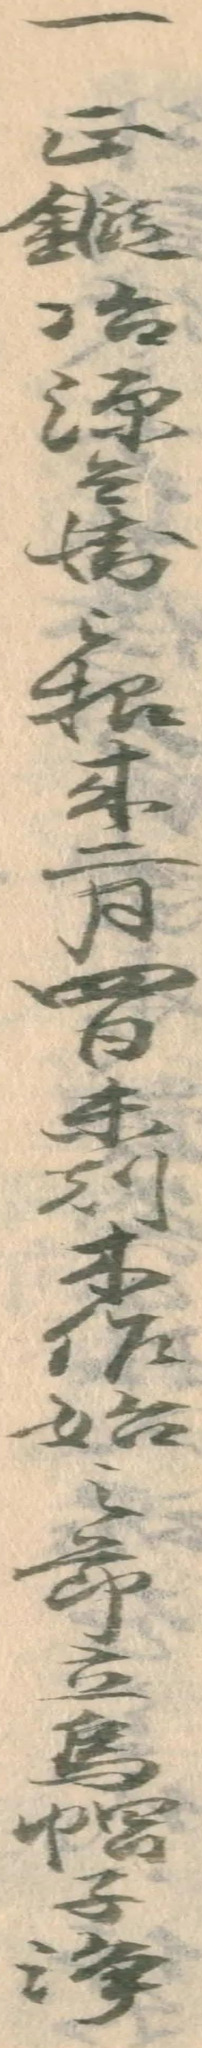一正鍛冶源兵衛被招来二月四日未刻木作始之節立烏帽子浄
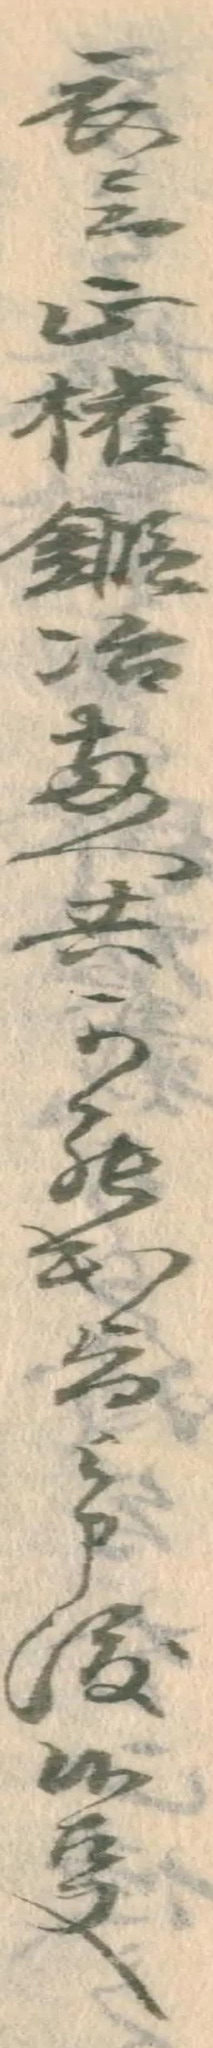衣ニ而正権鍛冶両人共可罷出旨被申渡候事
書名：賀茂社記録. 第17冊
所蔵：国立国会図書館 National Diet Library, JAPAN
